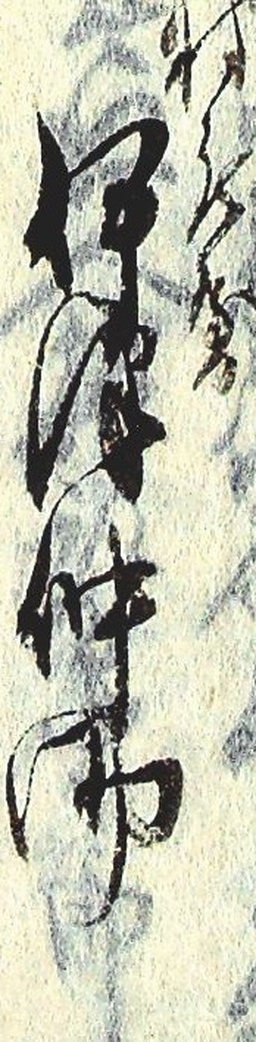伊沢仲助
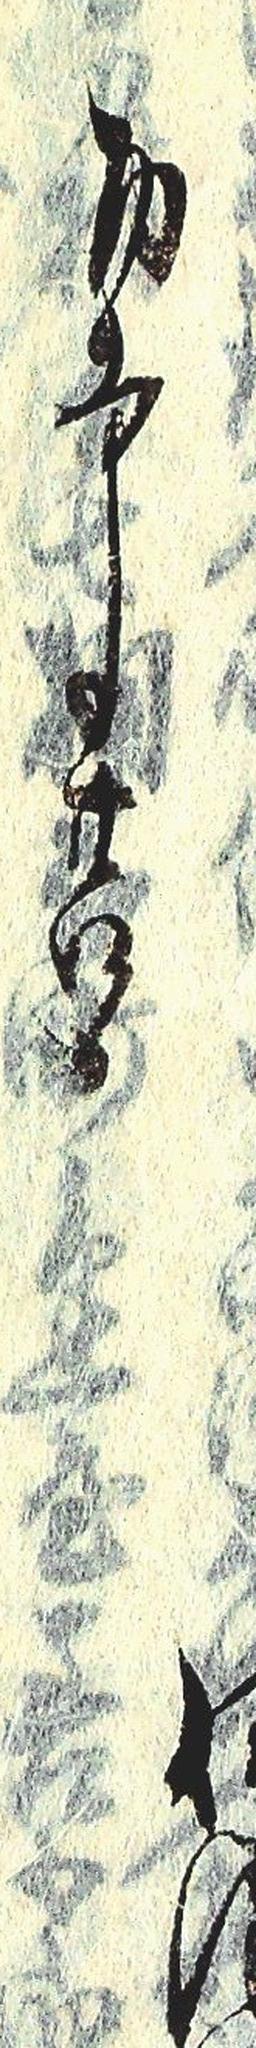酉十一月廿四日
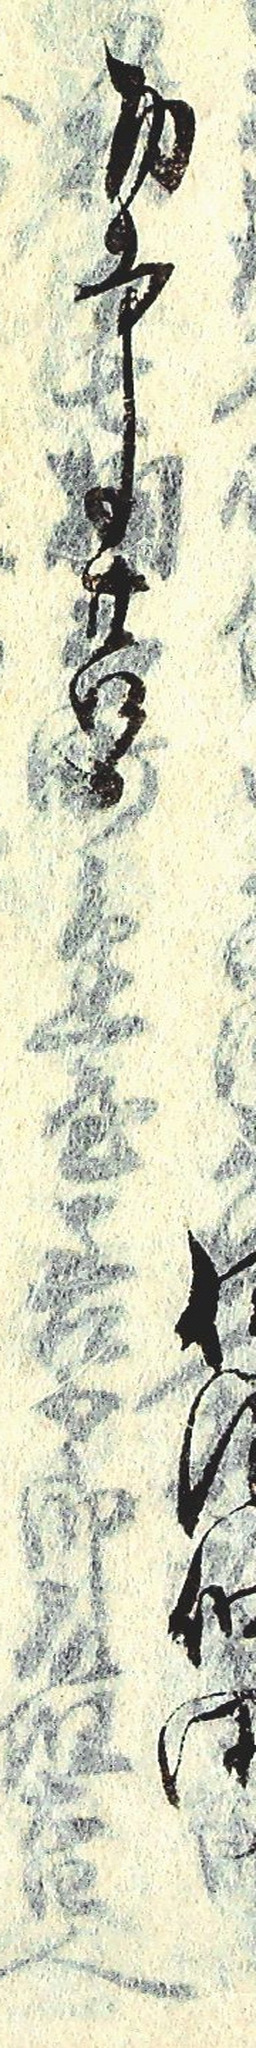酉十一月廿四日
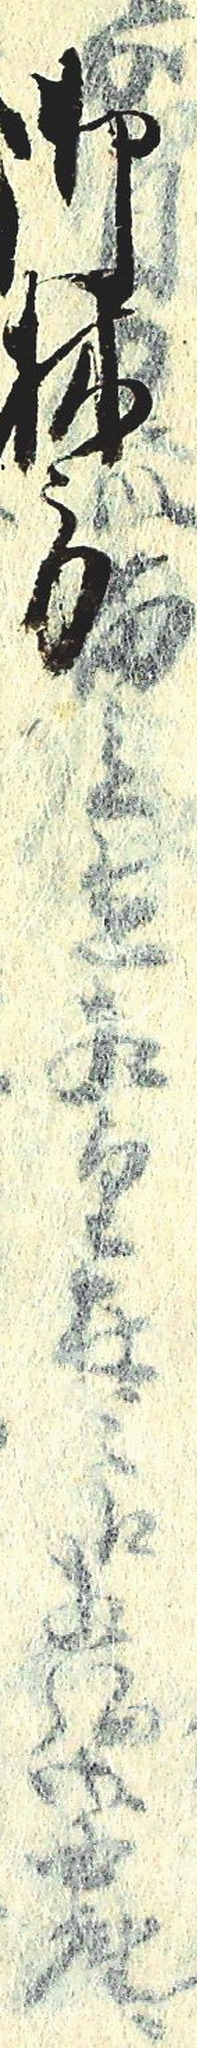御林方
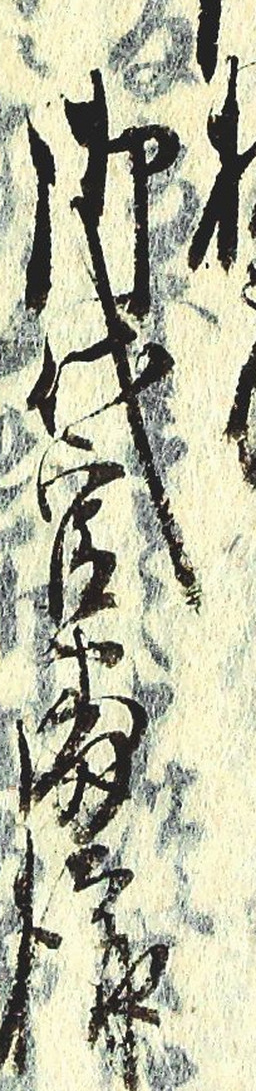御代官処様
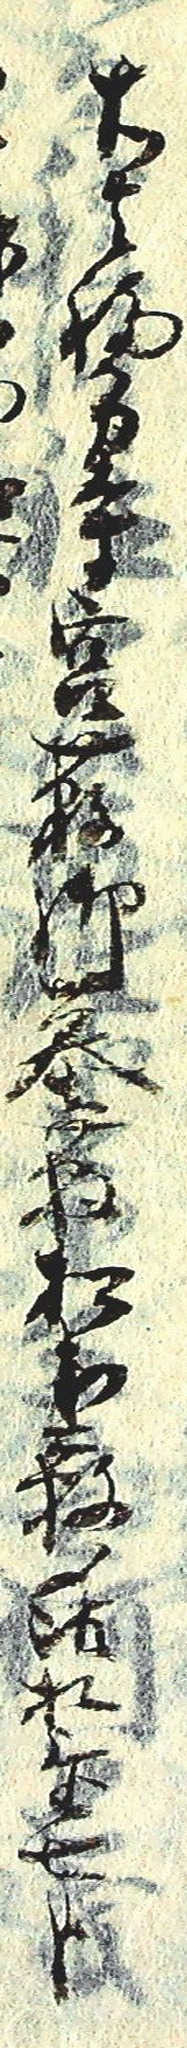右は福万寺宮藪御墓藪松下藪ノ銀札三匁七分
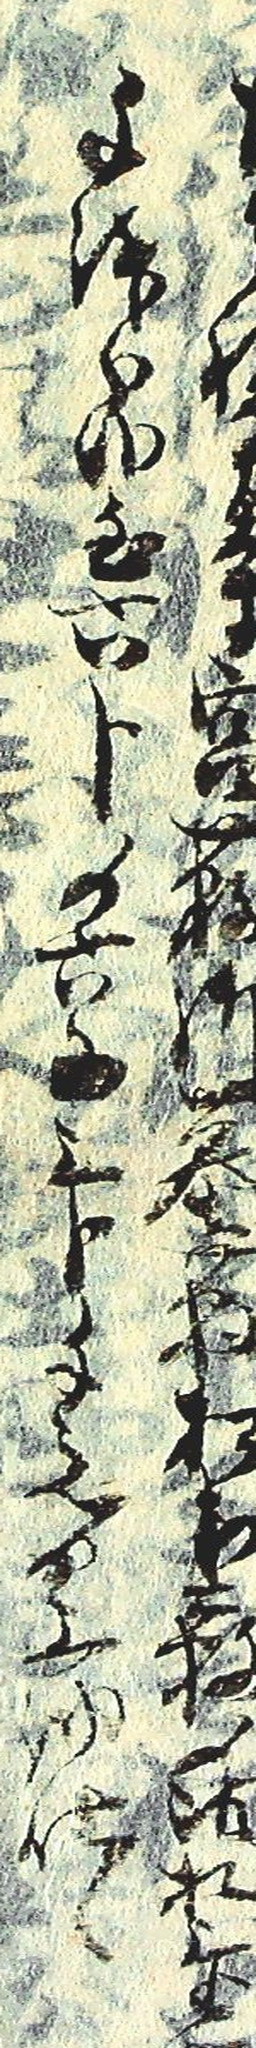手許分弐匁六分〆六匁三分手元ゟ上納仕候

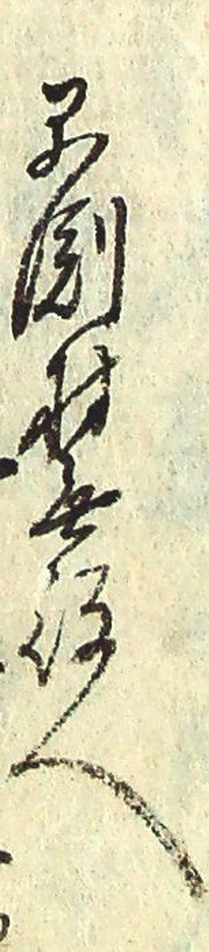早淵村無役人
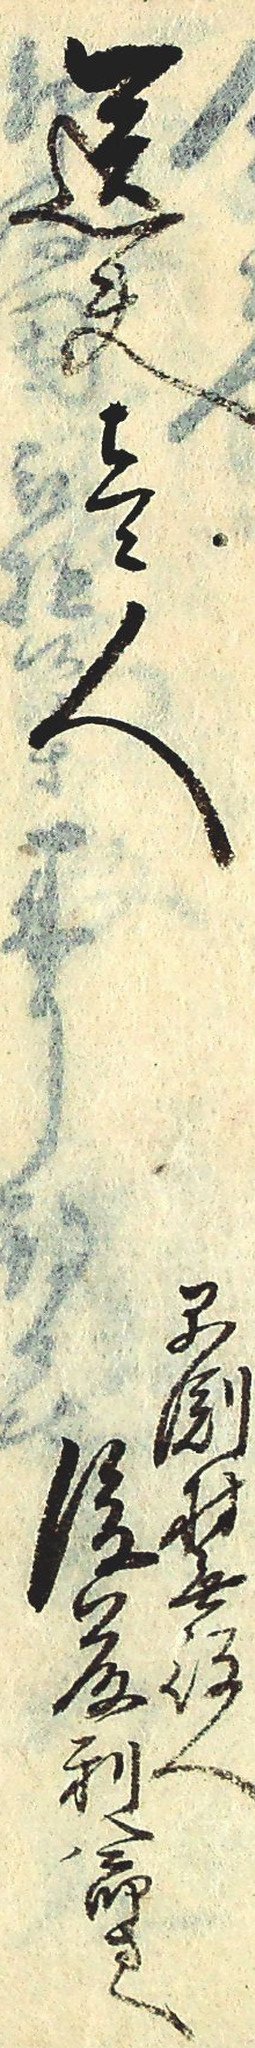送夫壱人後藤利八郎方へ
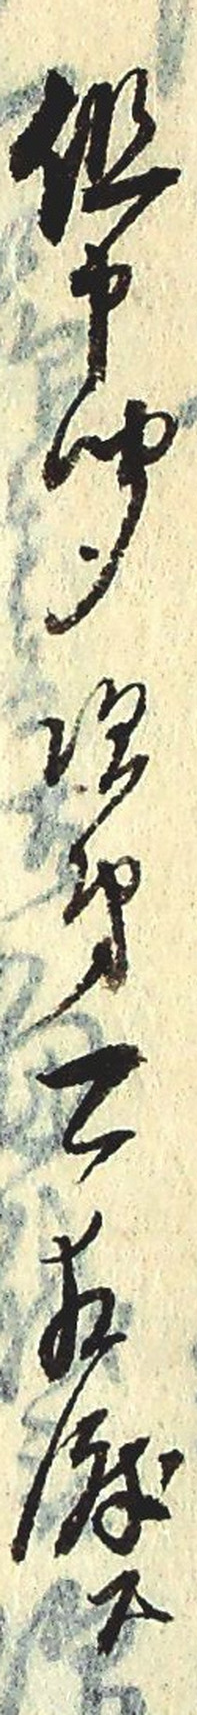但申聞次第可相渡候
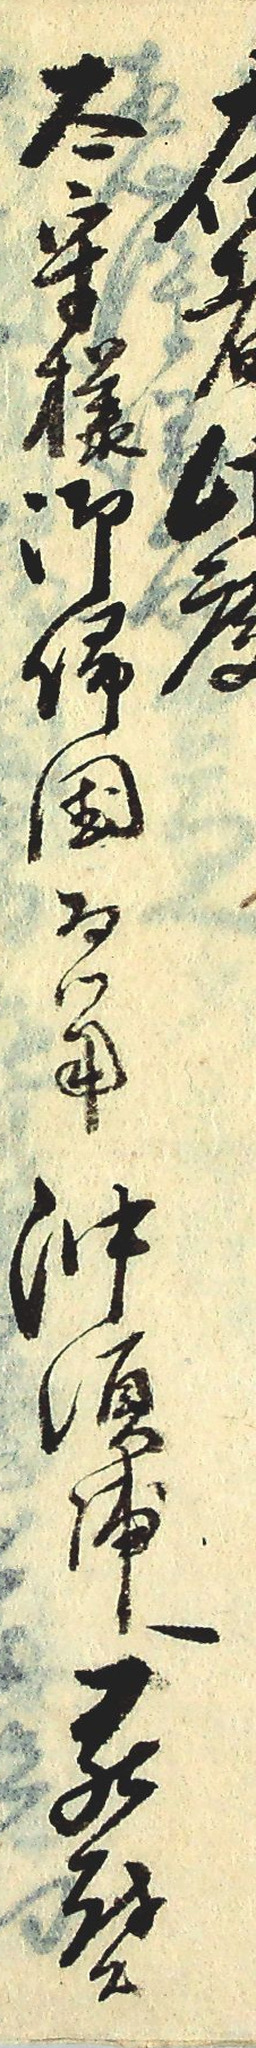太守様御帰国為御用沖須原へ罷越候
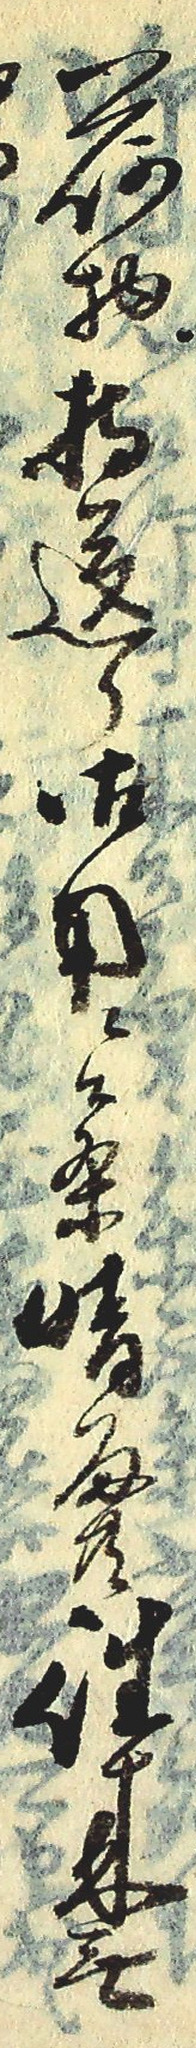荷物指送り御用に候条晴雨共往来無
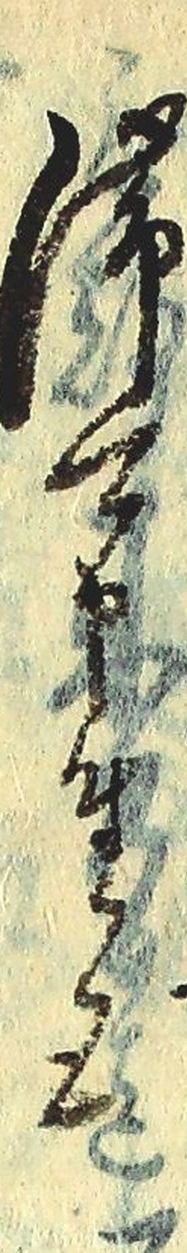滞可申付候以上
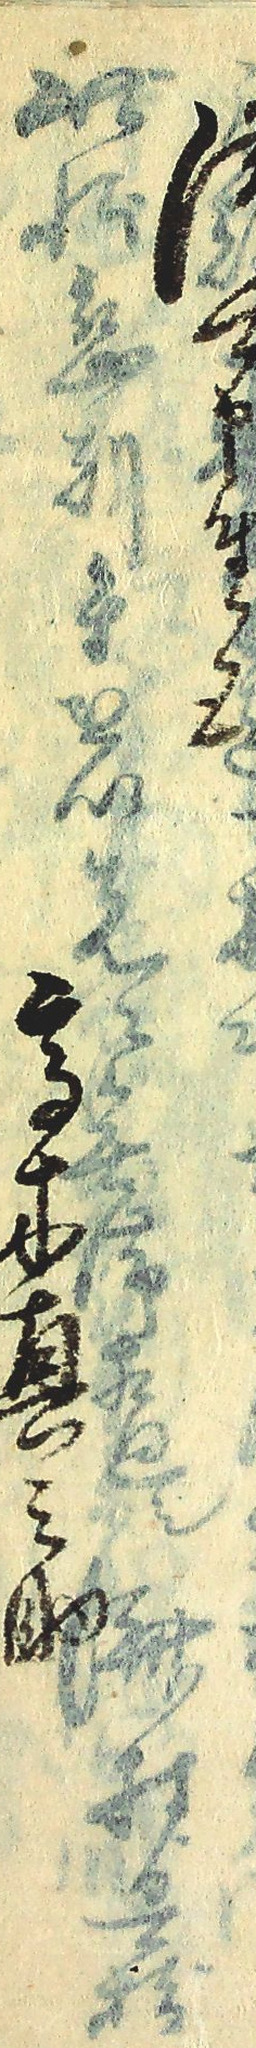高木真之助
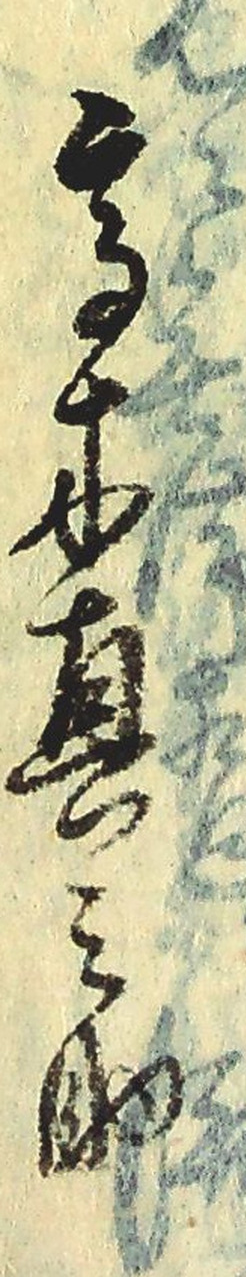高木真之助
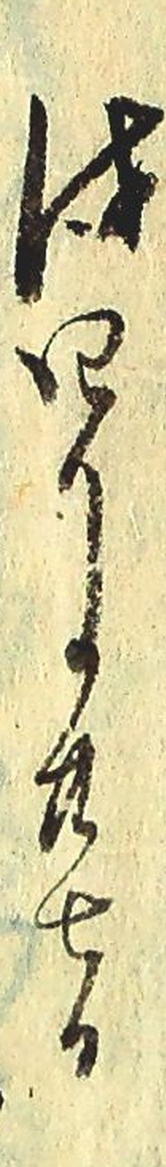戌四月廿七日
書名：諸御願書控(弐番）
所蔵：鳴門教育大学 Naruto University of Education
